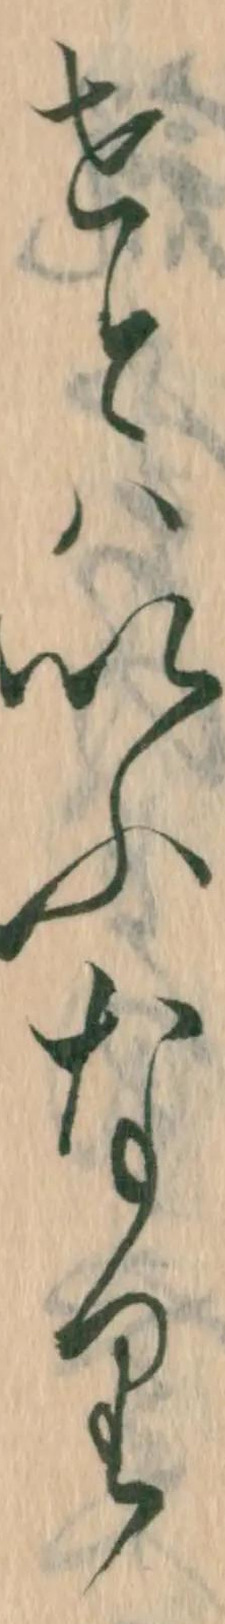せとはいふなり
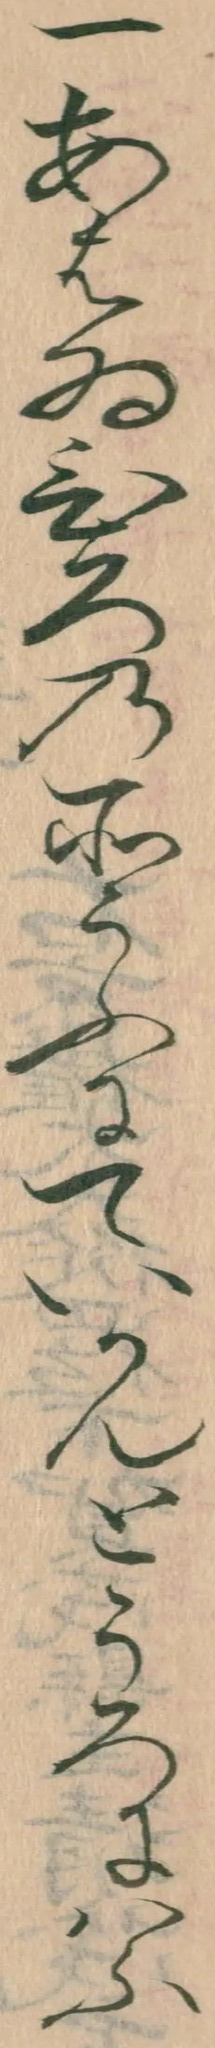一あはゐひろのそうふにていかんとうろにはふ
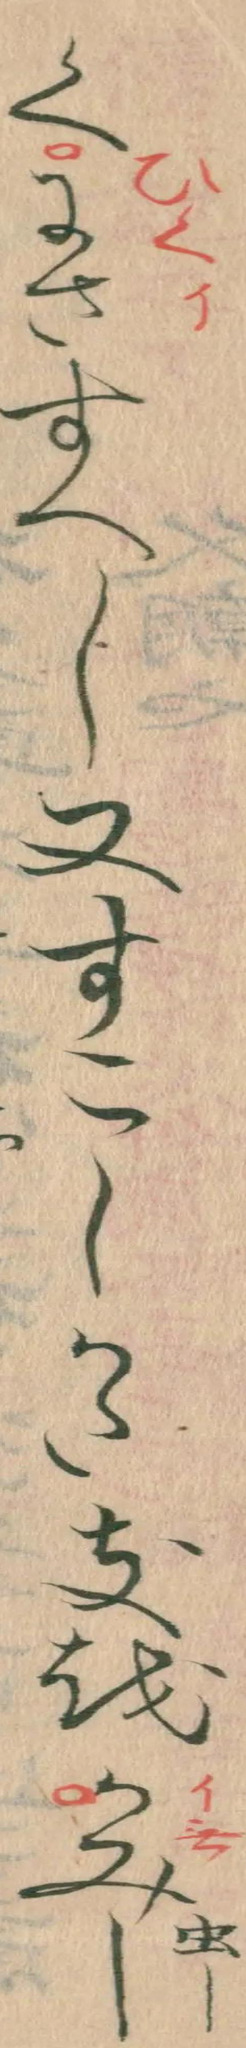く◦にさすへし又すこしかたきをかみ❘
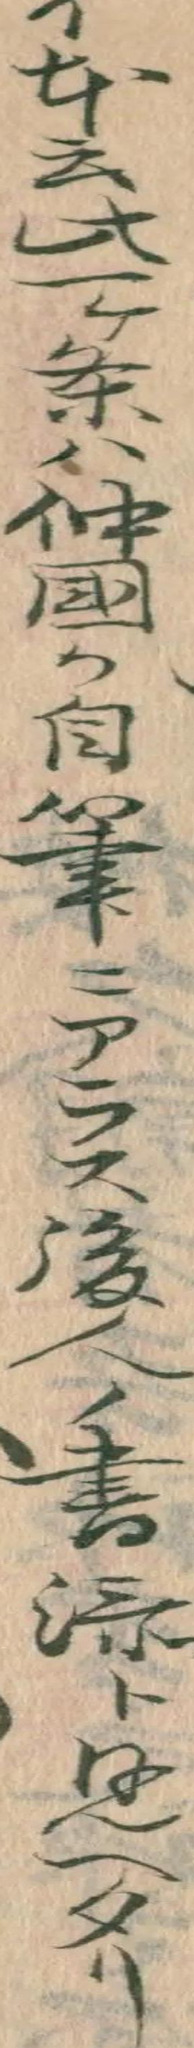イ本云此一ヶ条ハ仲国カ自筆ニアラス後人ノ書添ト見ヘタリ
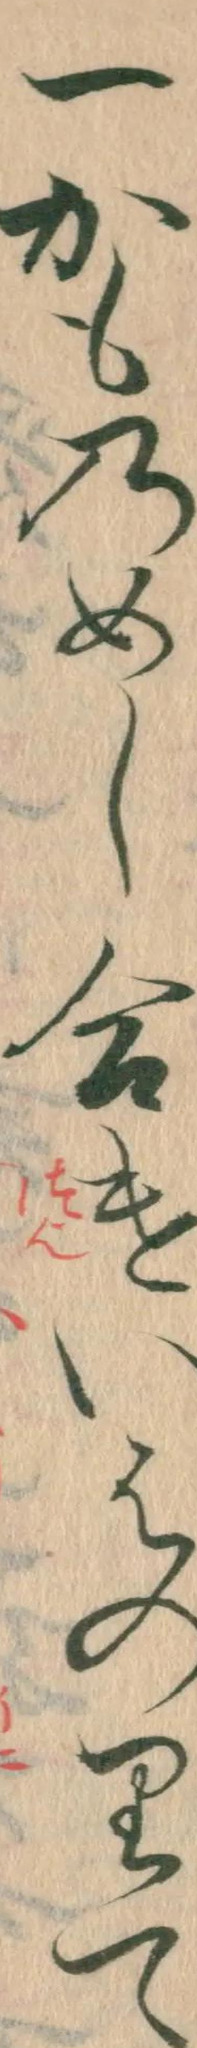一かものめし合けいはのりて
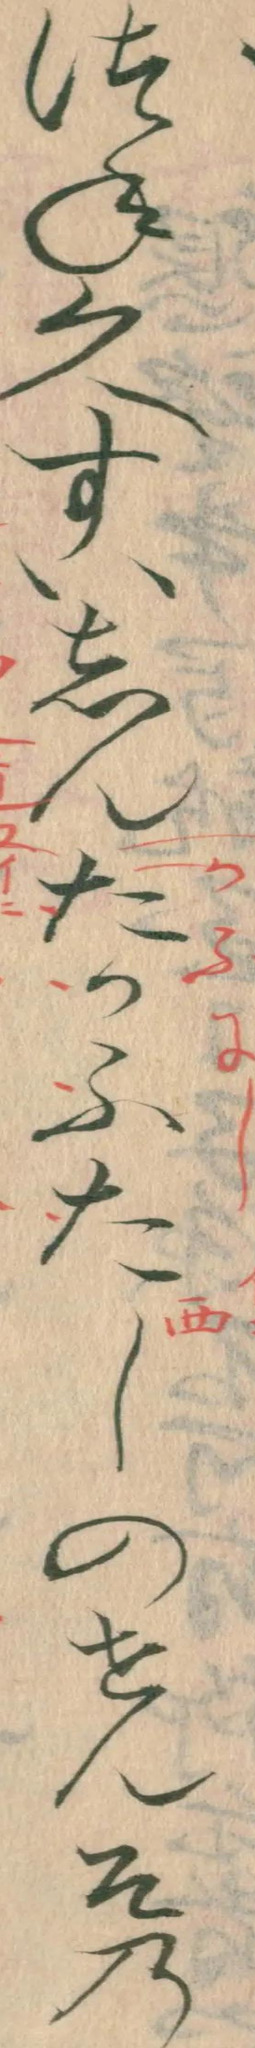つね久すいしん「たかふた」しのせんその
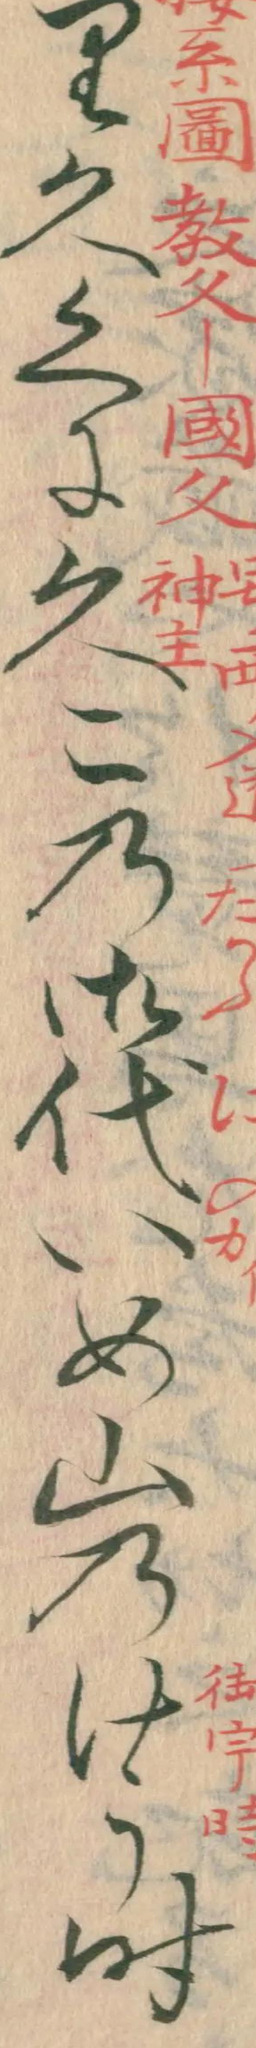り久くに久この御代いめ山のけう時
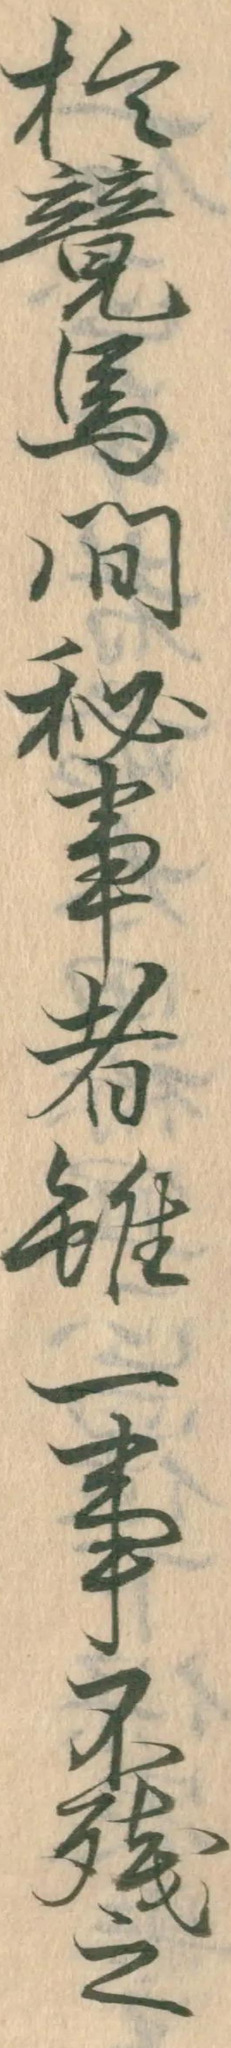於競馬間秘事者雖一事不残之
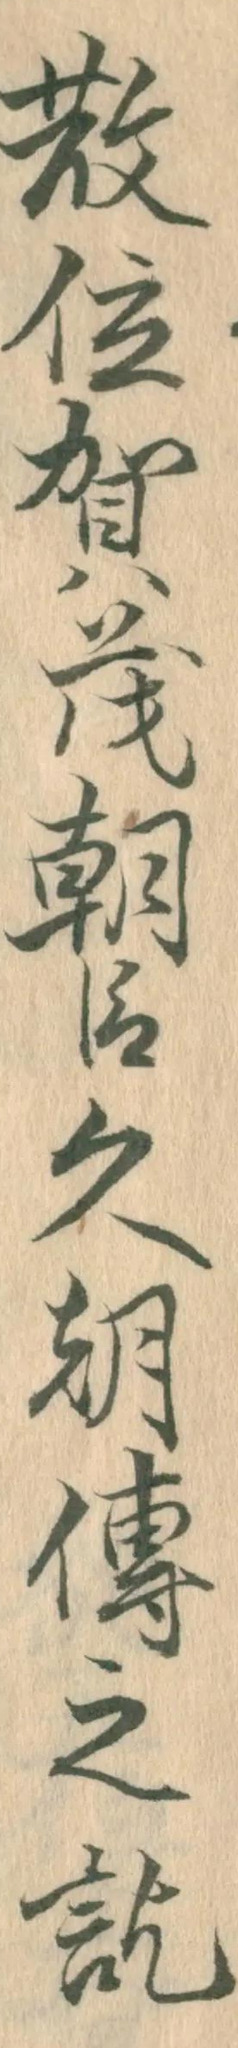散位賀茂朝臣久朝伝之訖
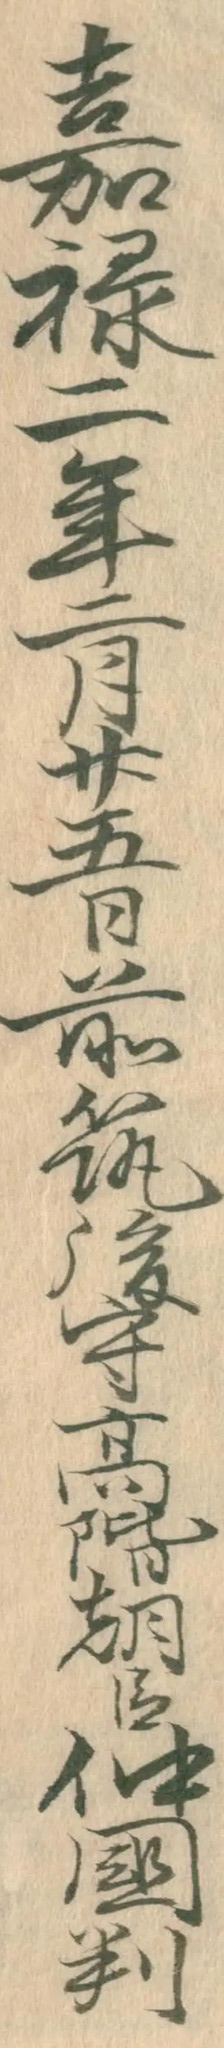嘉禄二年二月廿五日前筑後守高階朝臣仲国判

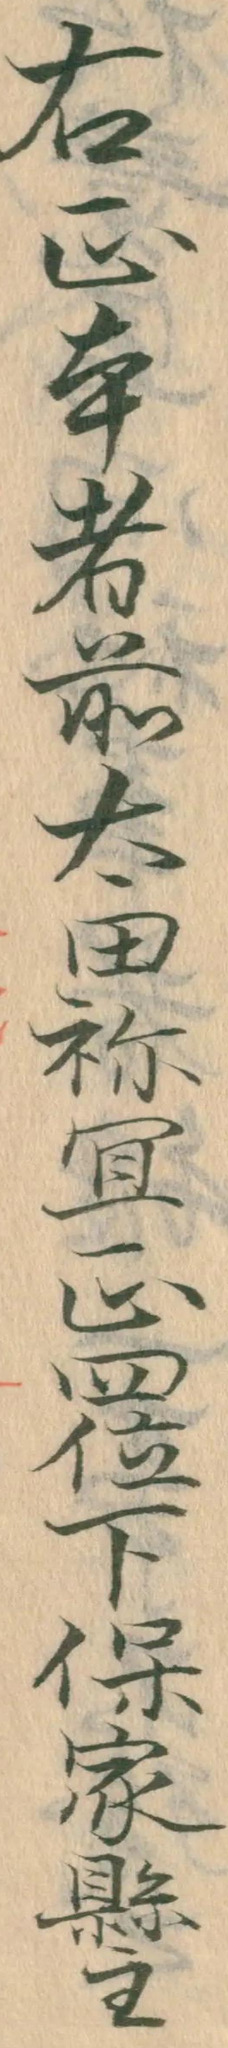右正本者前太田称宜正四位下保家県主
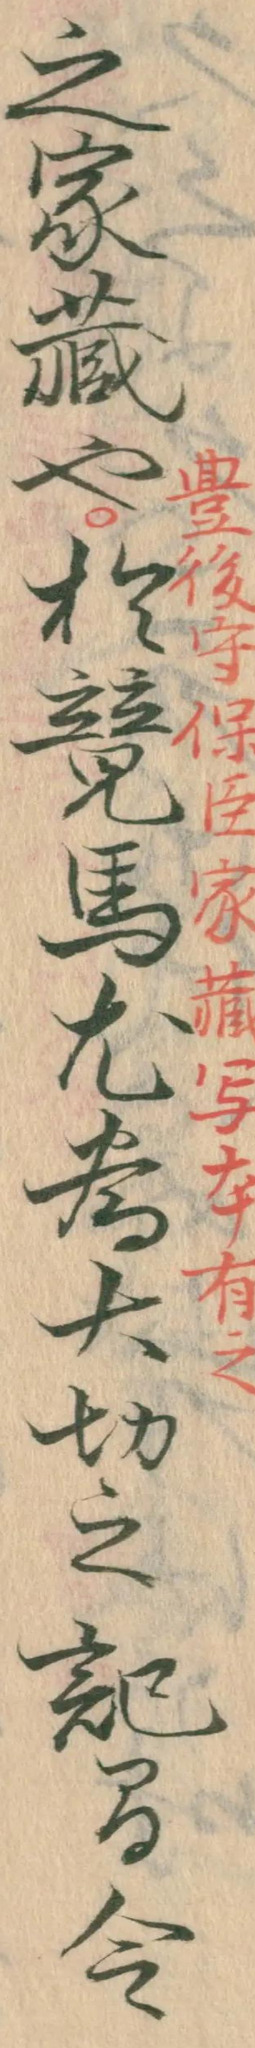之家蔵也◦於競馬尤為大切之記間令
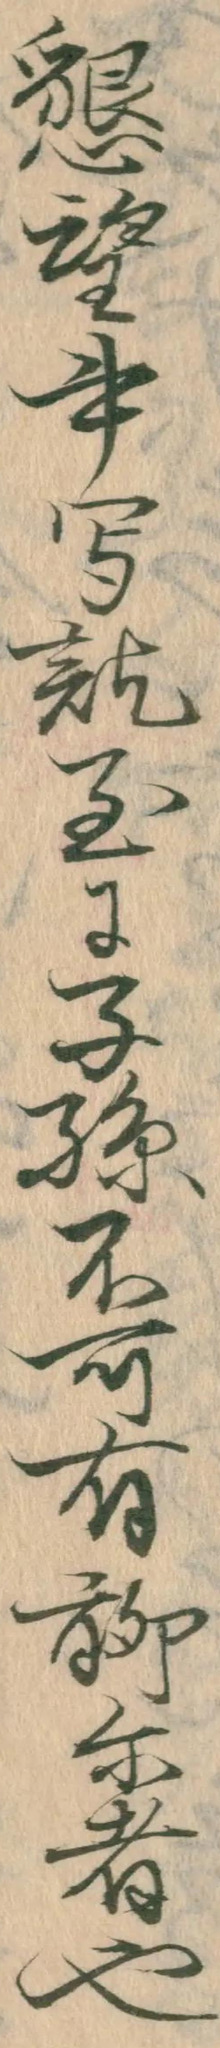懇望書写訖至に子孫不可有聊爾者也
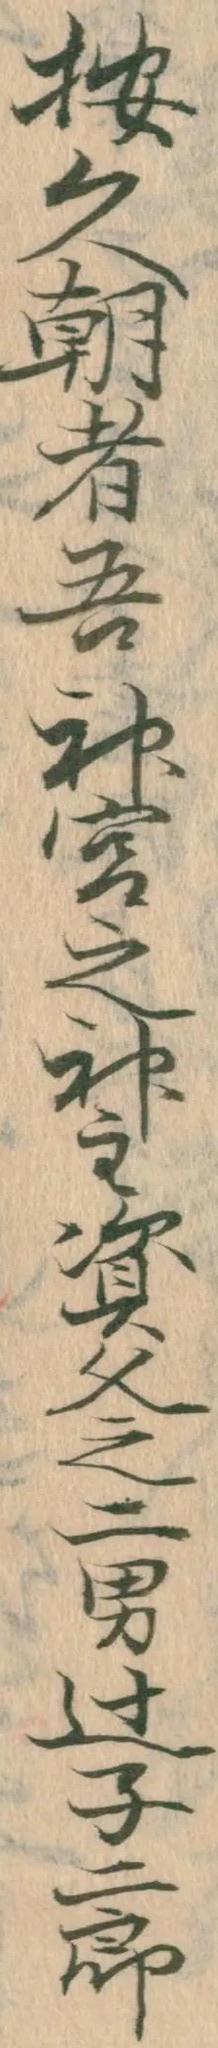按久朝者吾神宮之神主資父久二男辻子二郎
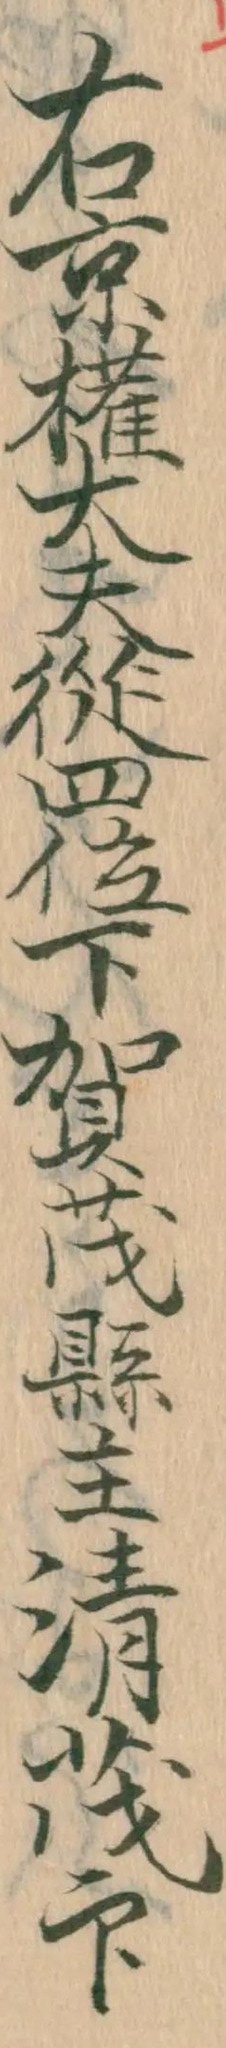右京権大夫従四位下賀茂県主清茂印
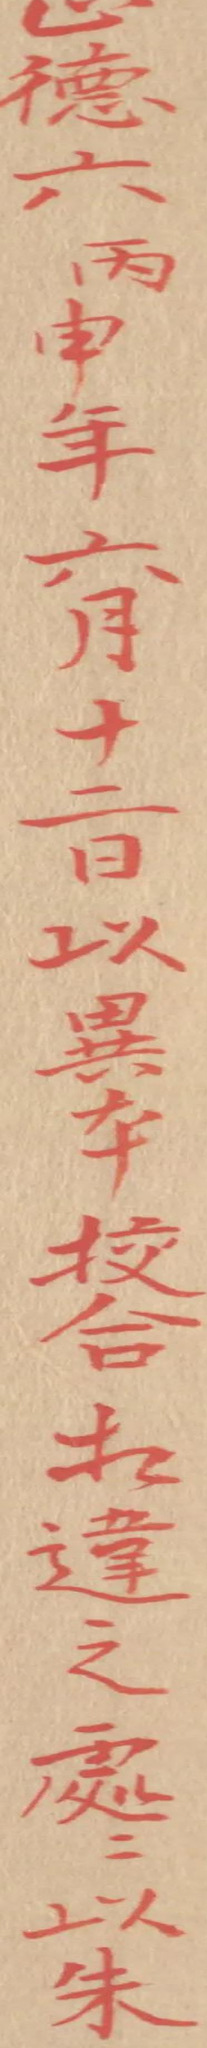正徳六丙申年六月十二日以異本校合相違之処ニ以来
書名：賀茂社記録. 第13冊
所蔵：国立国会図書館 National Diet Library, JAPAN
